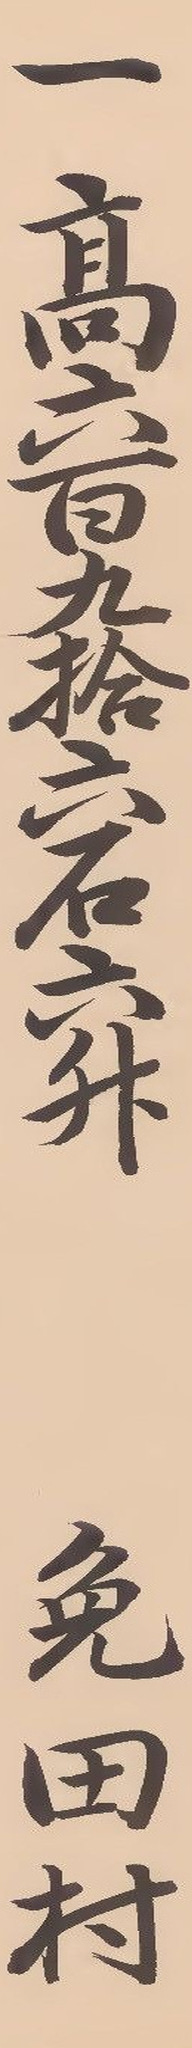一高六百九拾六石六升免田村
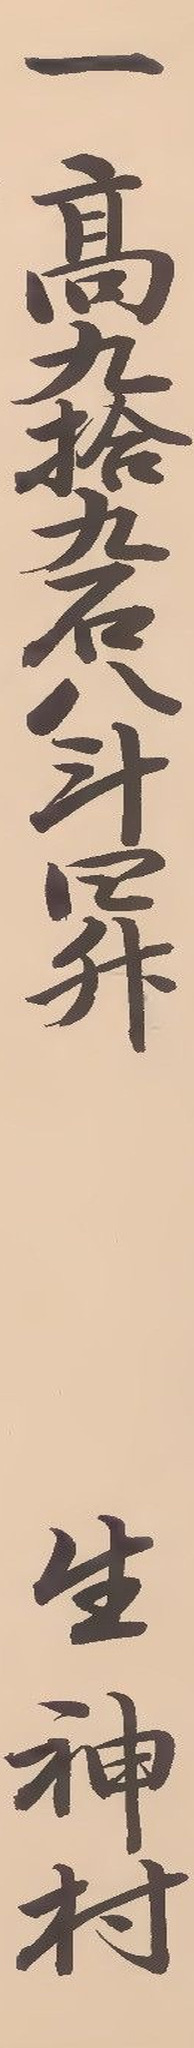一高九拾九石八斗四升生神村
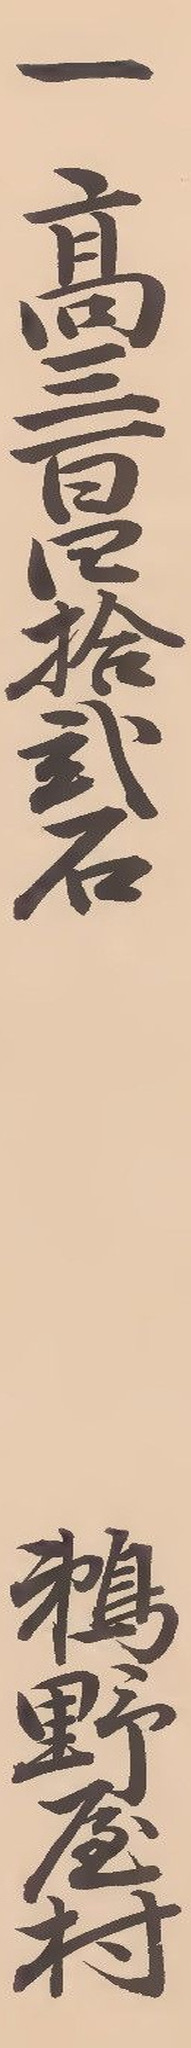一高三百四拾弐石鵜野屋村

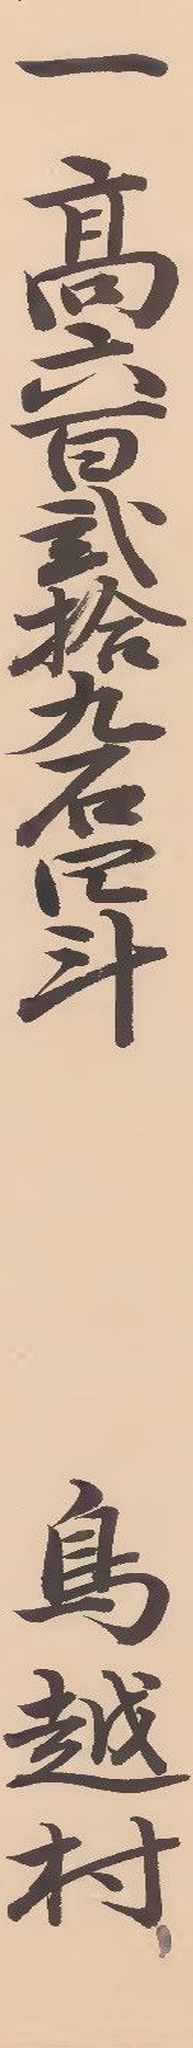一高六百弐拾九石四斗鳥越村
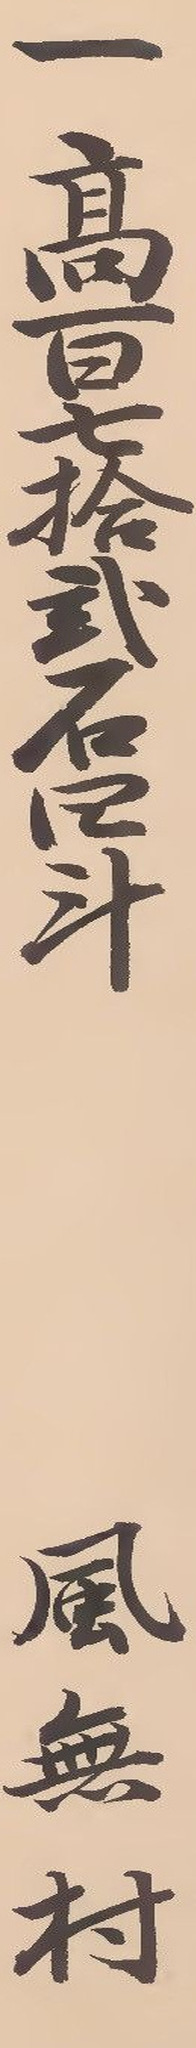一高百七拾弐石四斗風無村
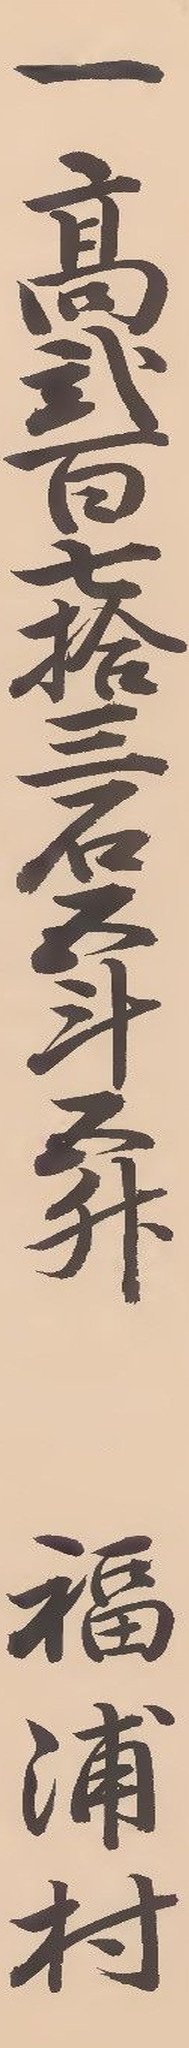一高弐百七拾三石五斗五升福浦村
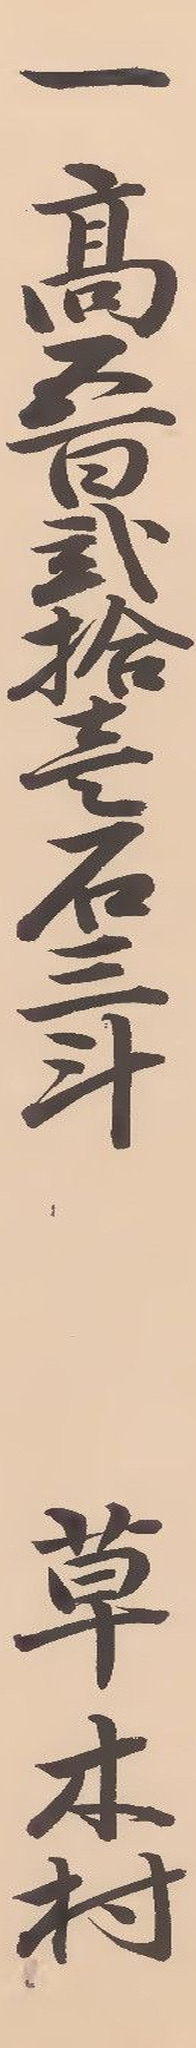一高五百弐拾壱石三斗草木村
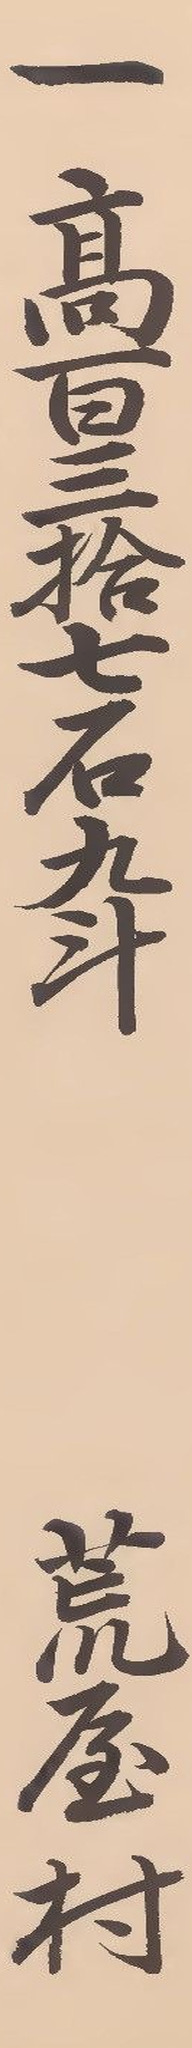一高百三拾七石九斗荒屋村

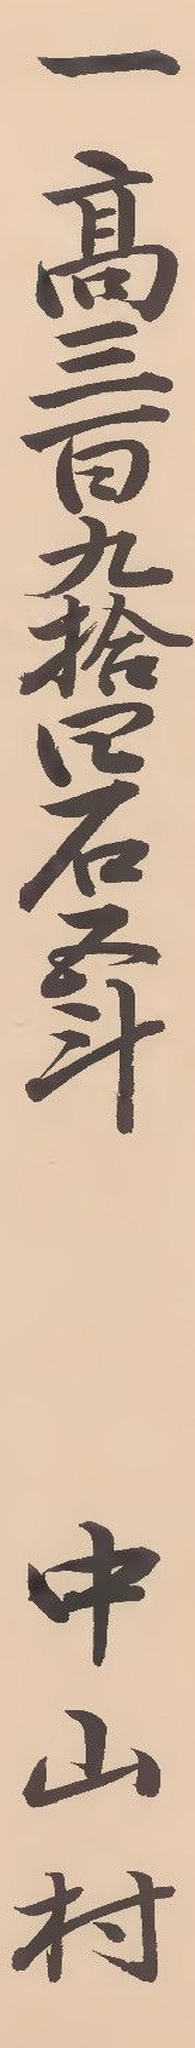一高三百九拾四石五斗中山村
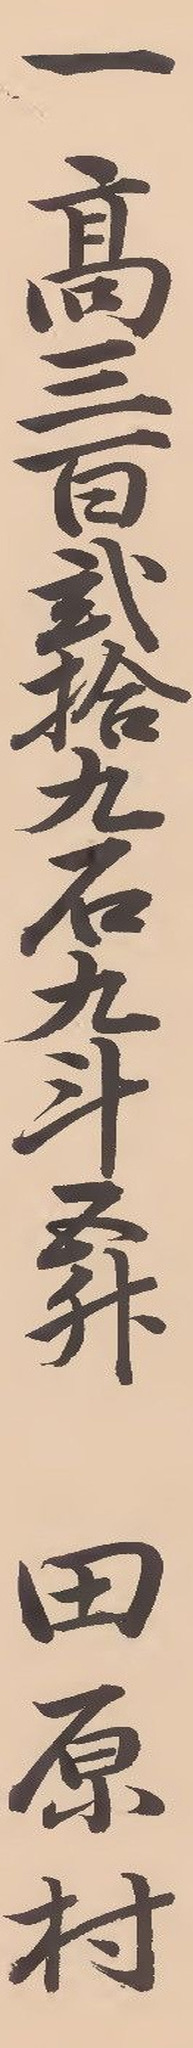一高三百弐拾九石九斗五升田原村
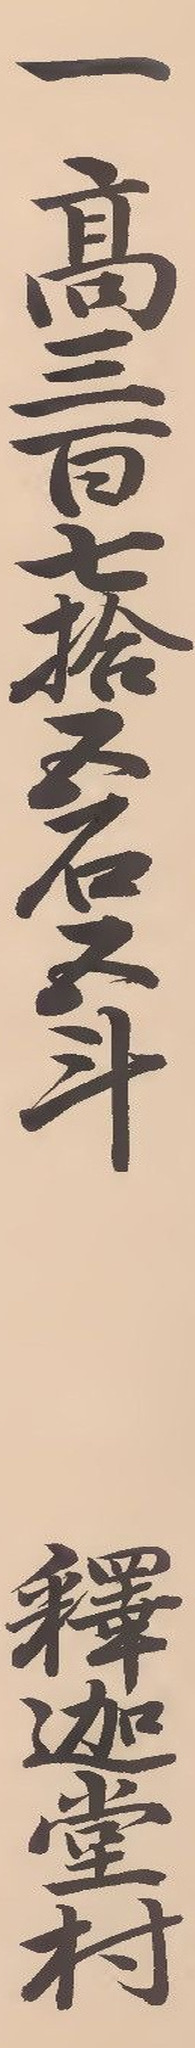一高三百七拾五石五斗釈迦堂村
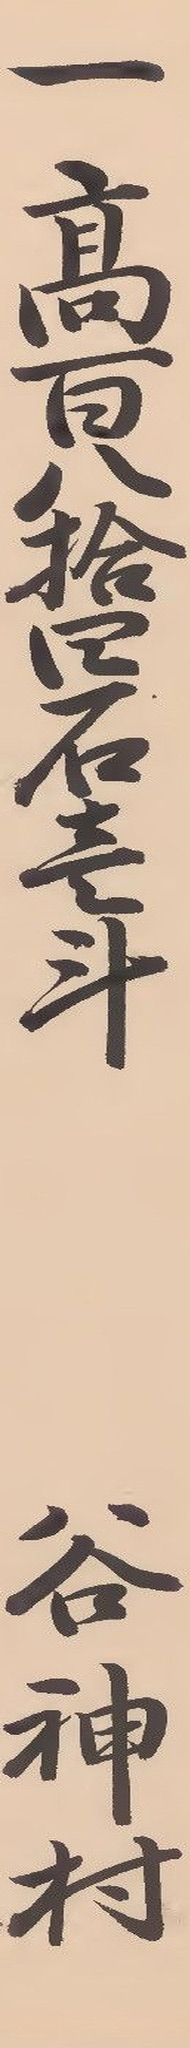一高百八拾四石壱斗谷神村
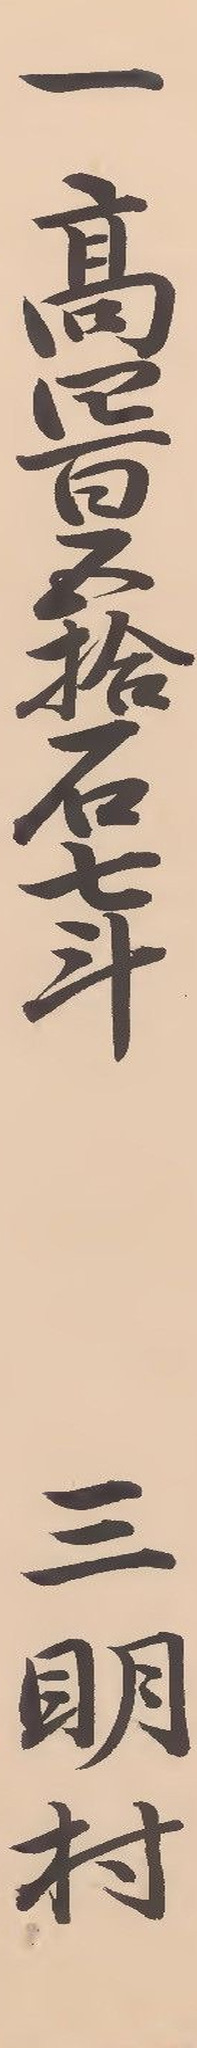一高四百五拾石七斗三明村
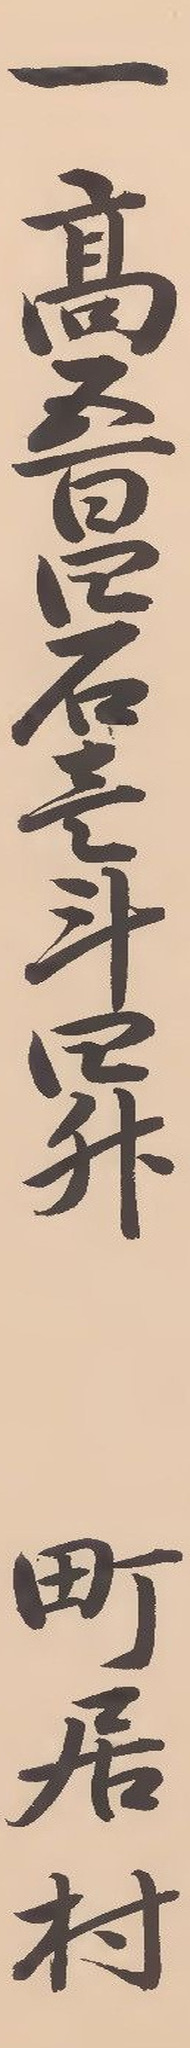一高五百四石壱斗四升町居村

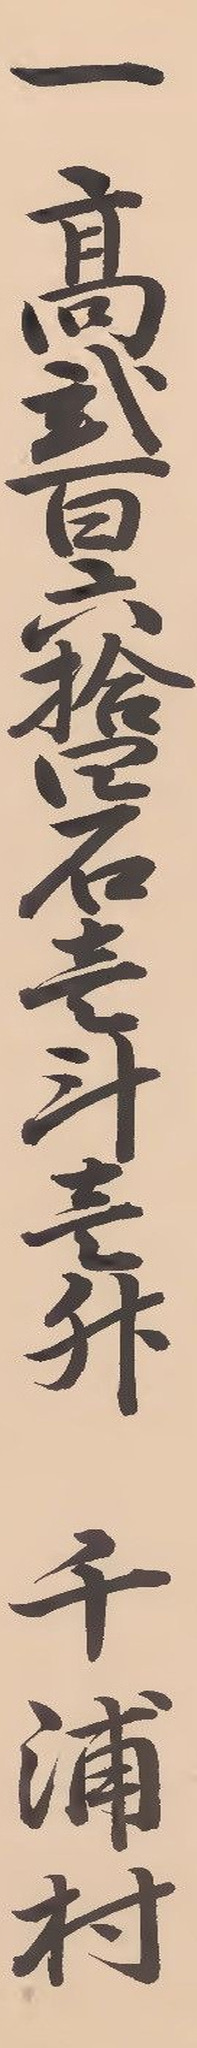一高弐百六拾四石壱斗壱升千浦村
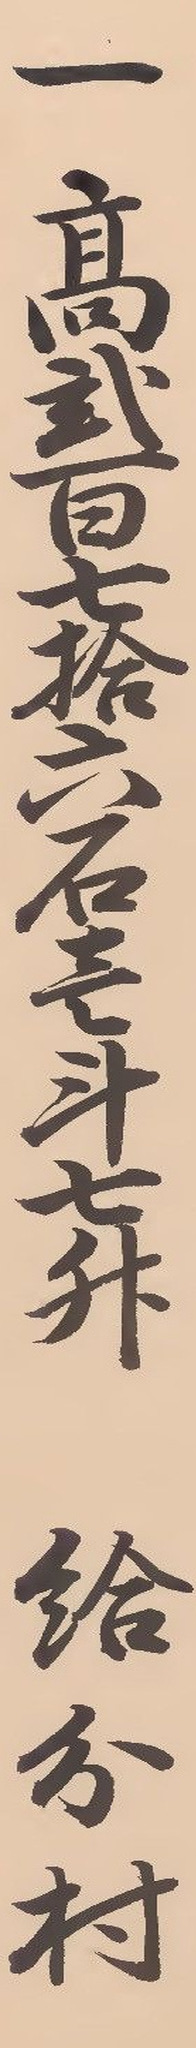一高弐百七拾六石壱斗七升給分村
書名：能登国郷帳
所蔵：国立公文書館 National Archives of Japan
